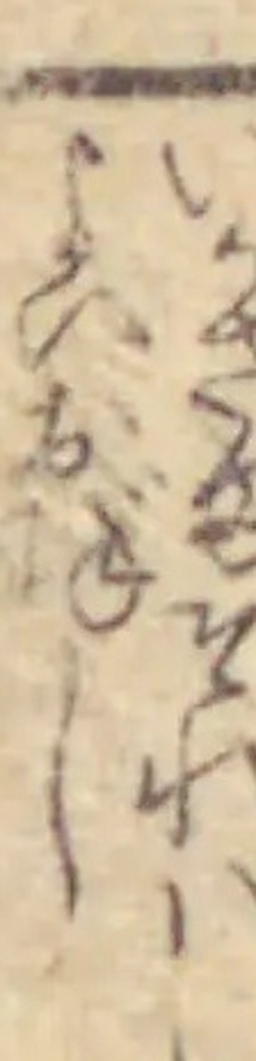よいおぼし
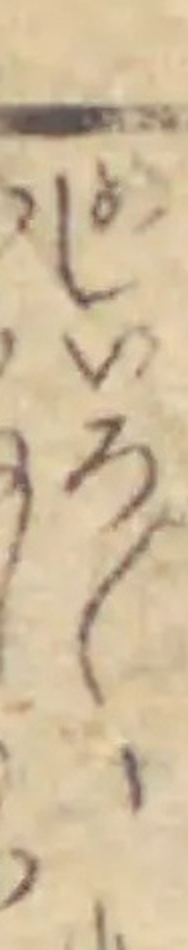めしいろ〳〵
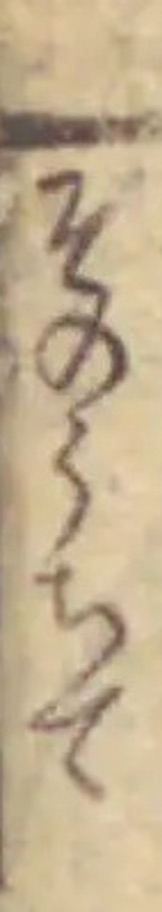そのうちて
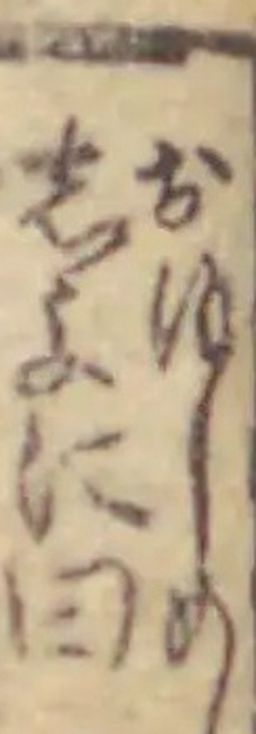しよに曰
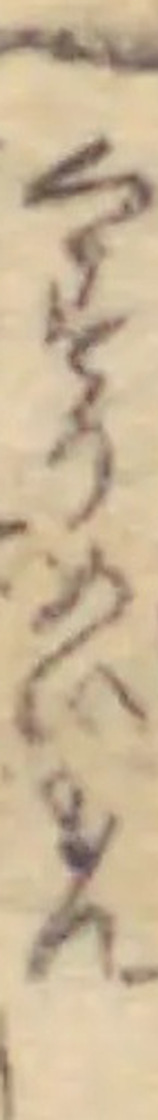くすりめはもん
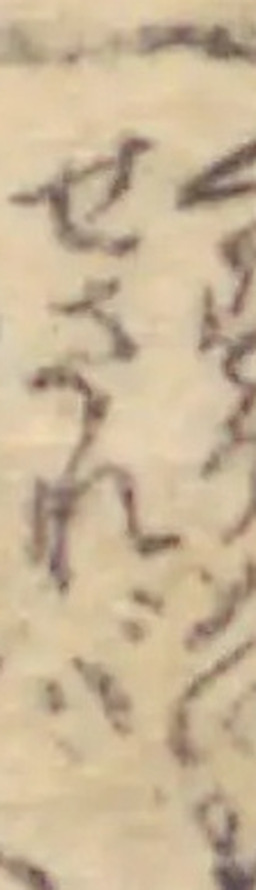せされば
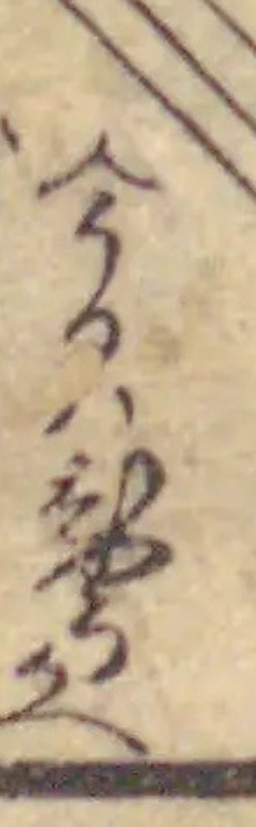今日はひやうかへ
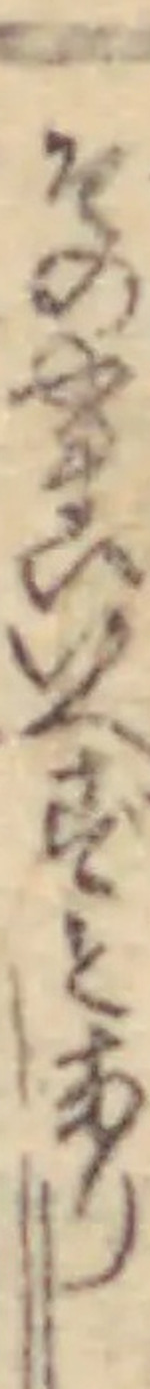そのやまいいへずとあり
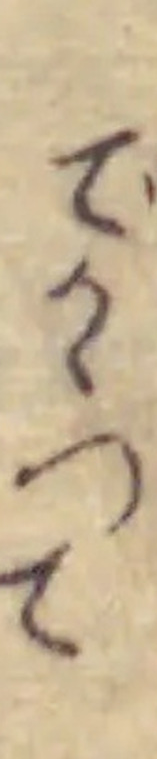でかゝつて
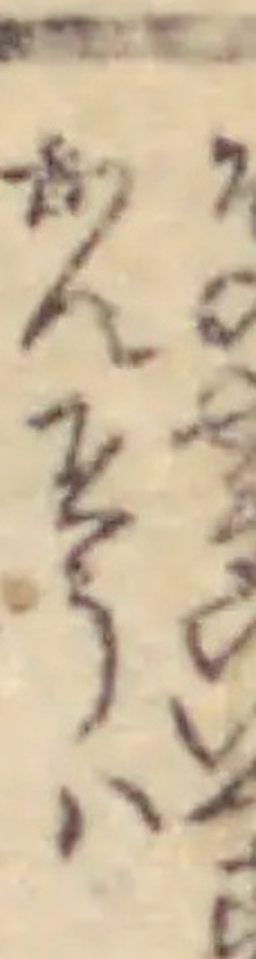かんそうは
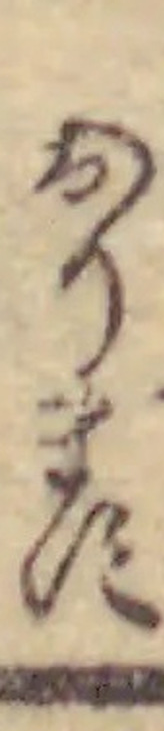おります
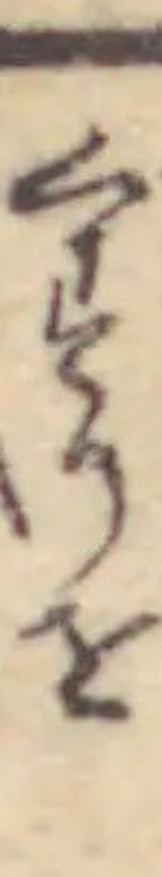くすりを
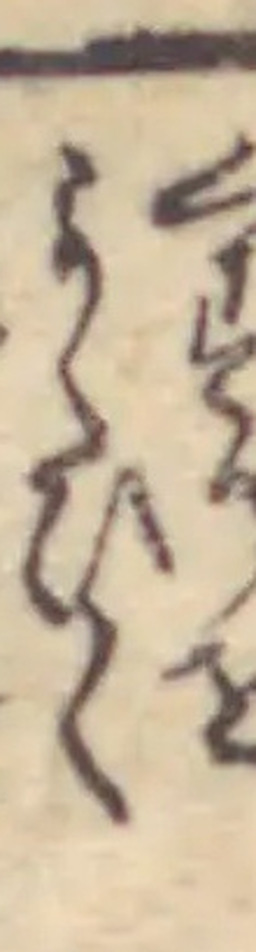よくひく
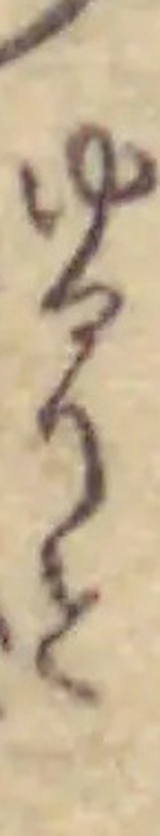ゆるりと
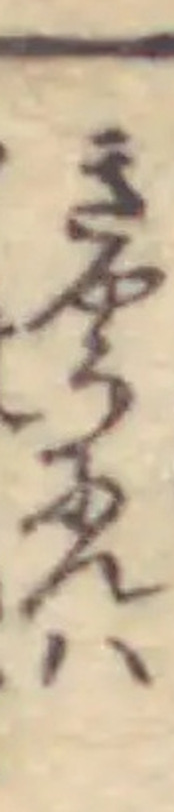きやうにんは
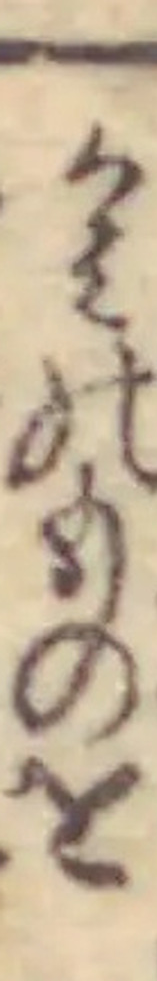かみのものを
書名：家伝寿命薬 2巻
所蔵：国立国会図書館 National Diet Library, JAPAN
